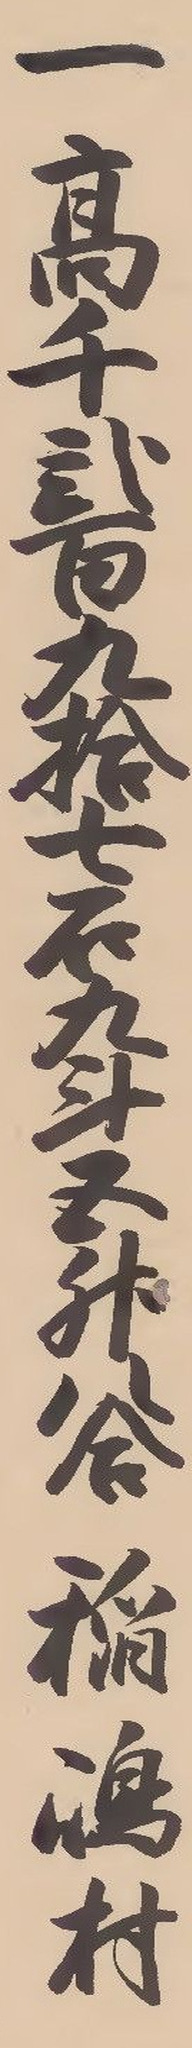一高千弐百九拾七石九斗五升八合稲島村

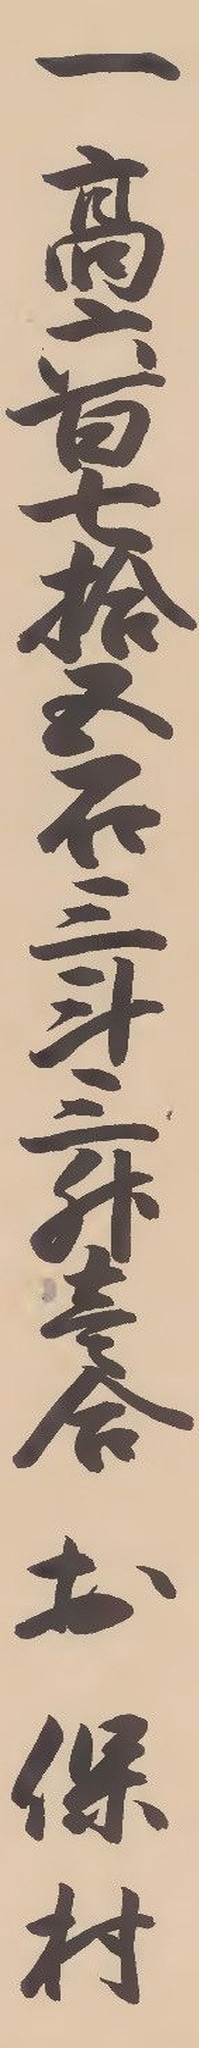一高六百七拾五石三斗三升壱合於保村
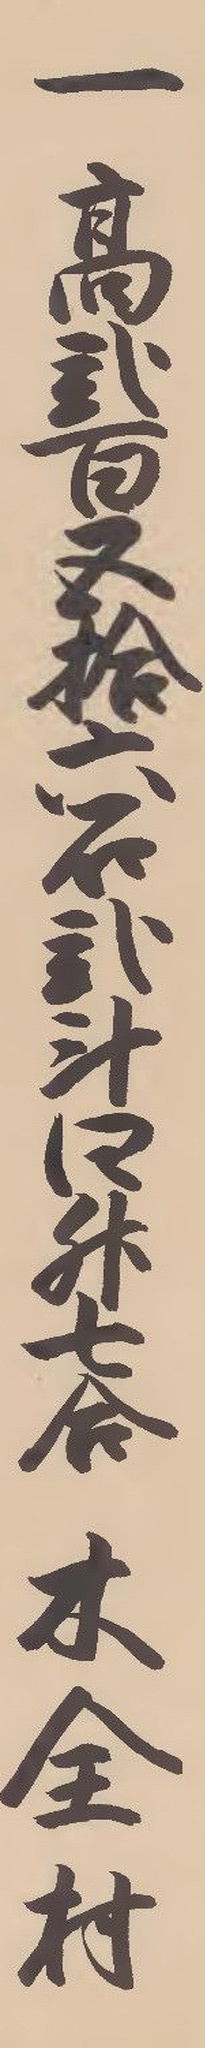一高弐百五拾六石弐斗四升七合木全村
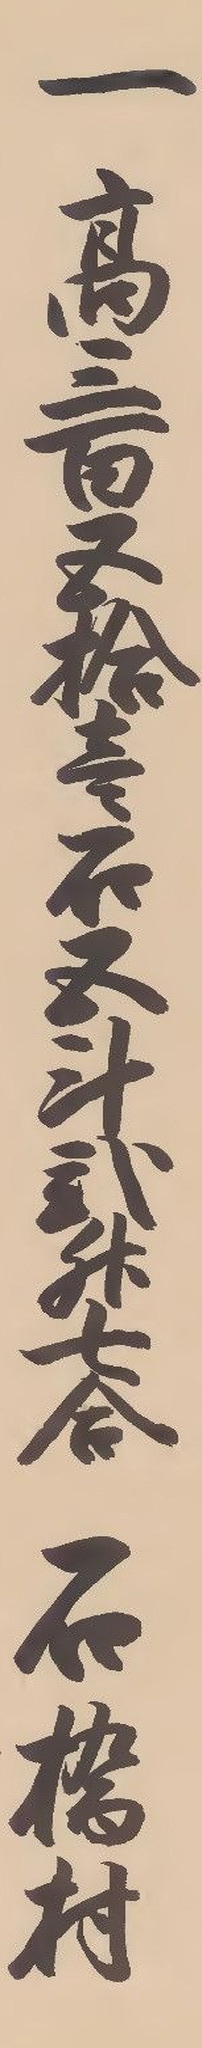一高三百五拾壱石五斗弐升七合石橋村
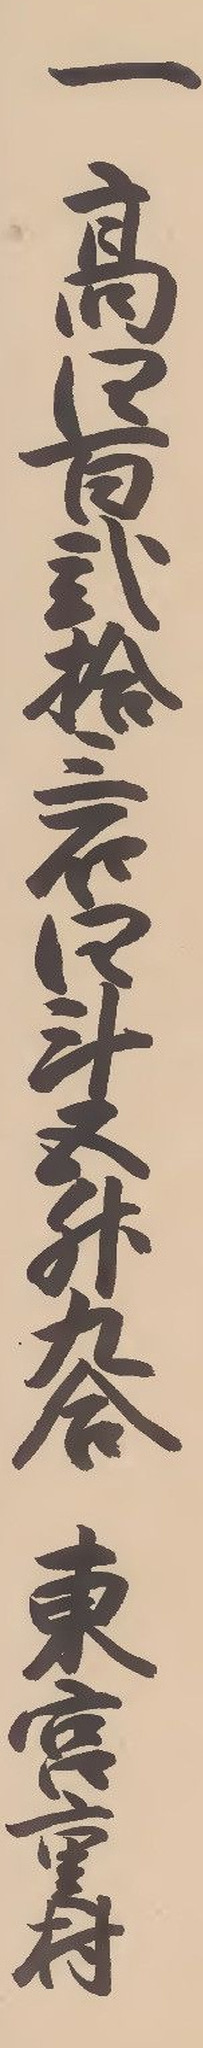一高四百弐拾三石四斗五升九合東宮重村
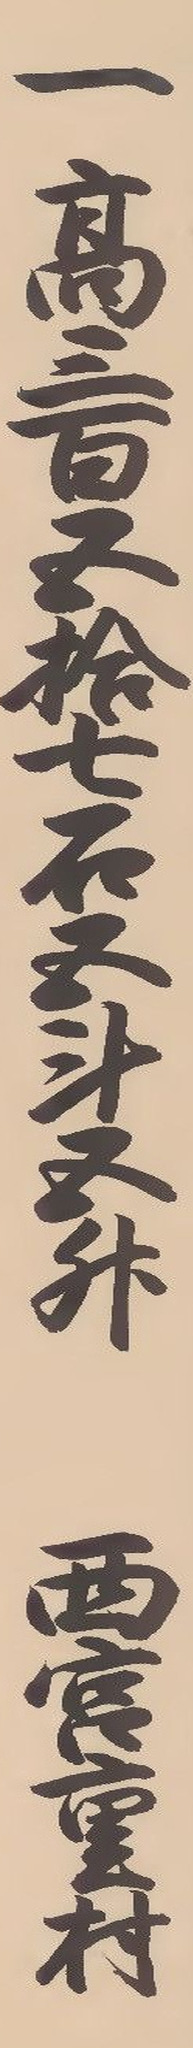一高三百五拾七石五斗五升西宮重村
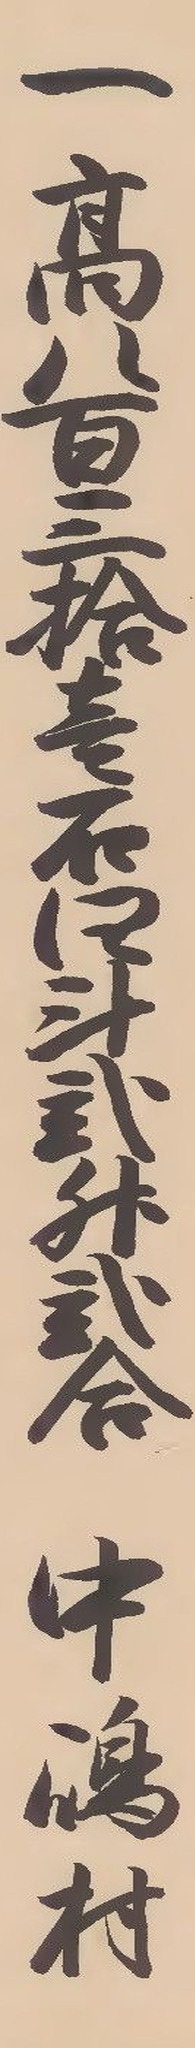一高八百三拾壱石四斗弐升弐合中島村
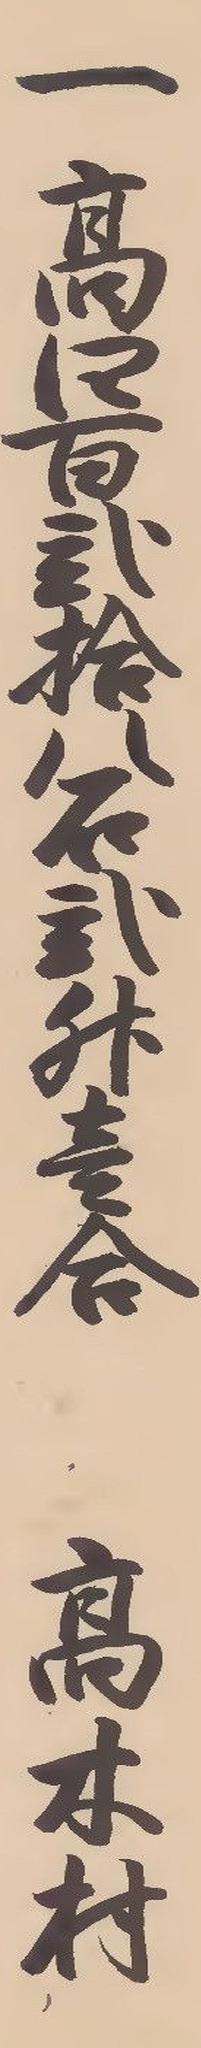一高四百弐拾八石弐升壱合高木村
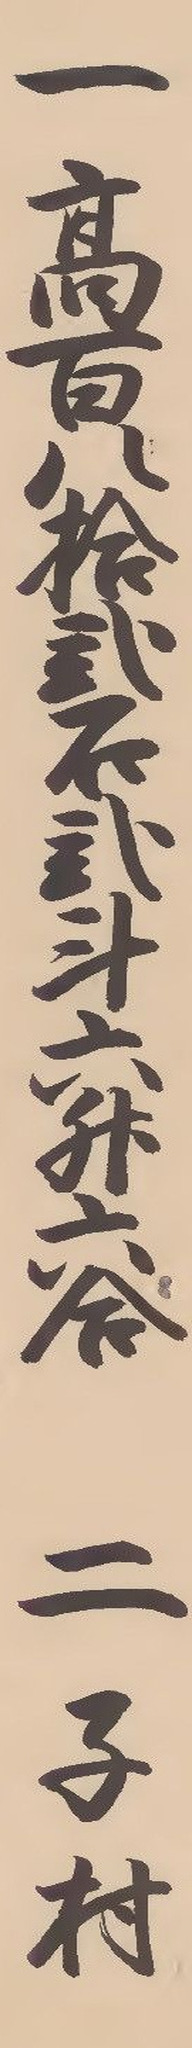一高百八拾弐石弐斗六升六合二子村

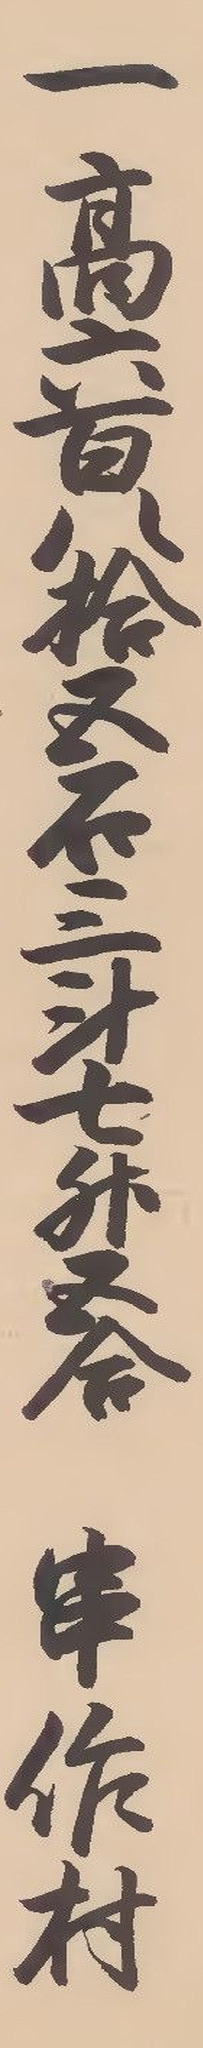一高六百八拾五石三斗七升五合串作村
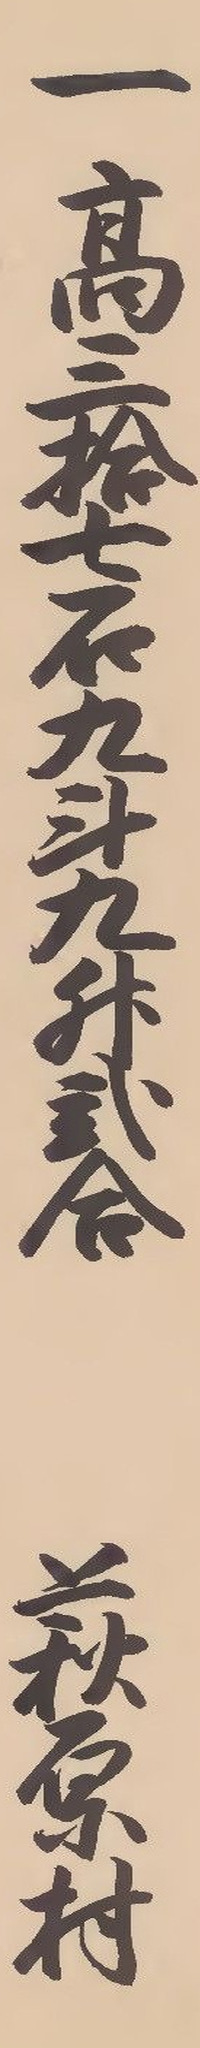一高三拾七石九斗九升弐合萩原村
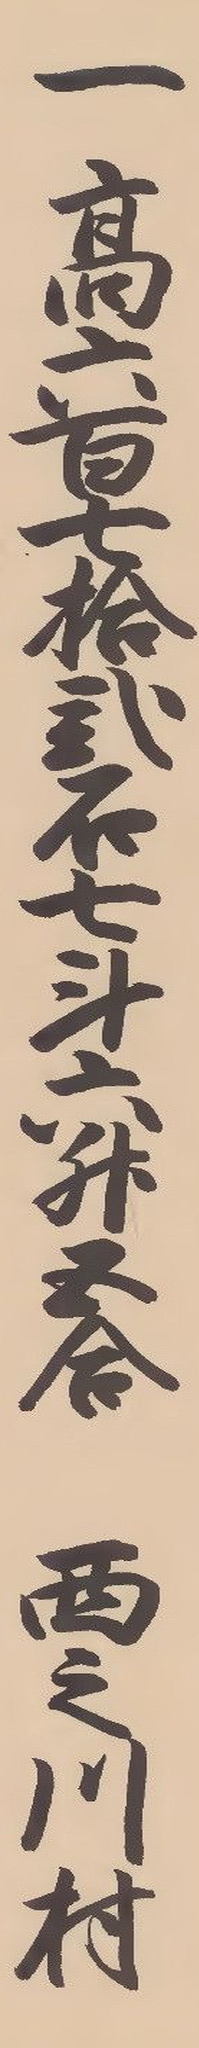一高六百七拾弐石七斗六升五合西之川村
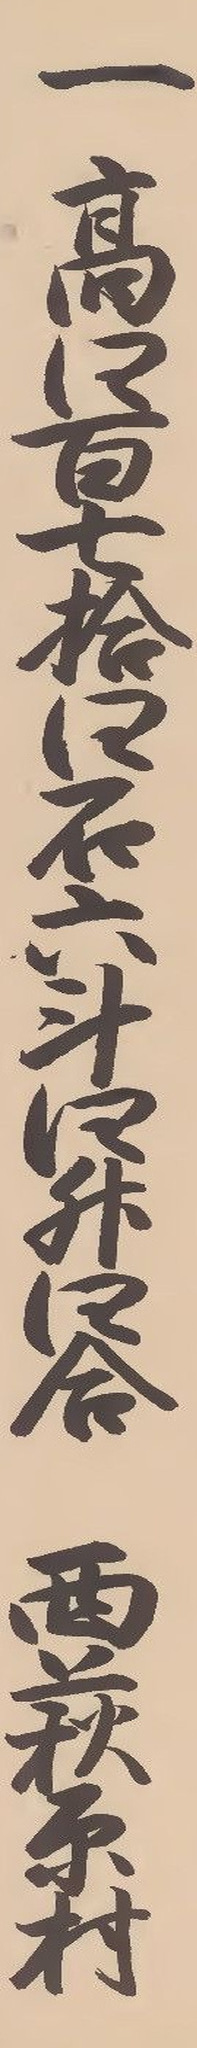一高四百七拾四石六斗四升四合西萩原村
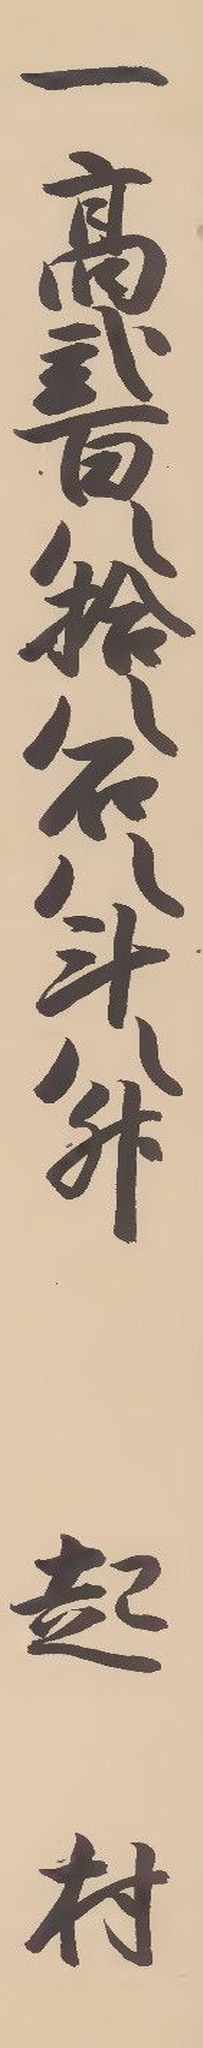一高弐百八拾八石八斗八升起村
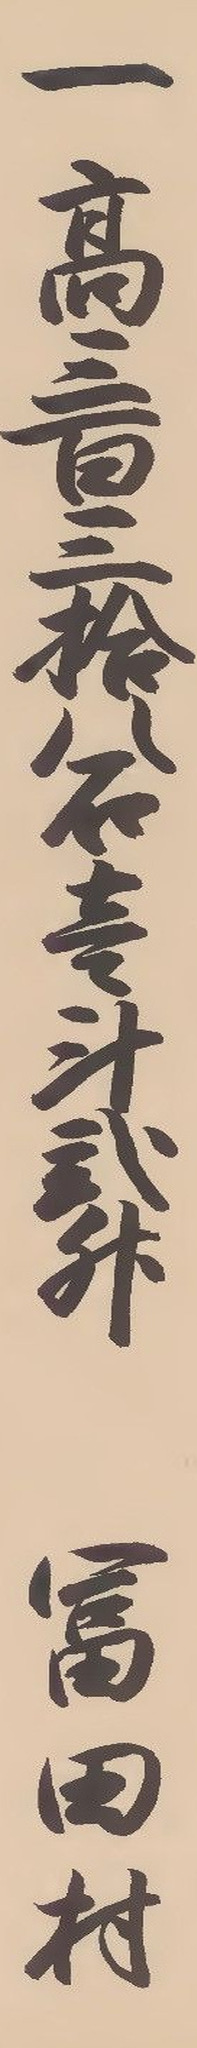一高三百三拾八石壱斗弐升富田村
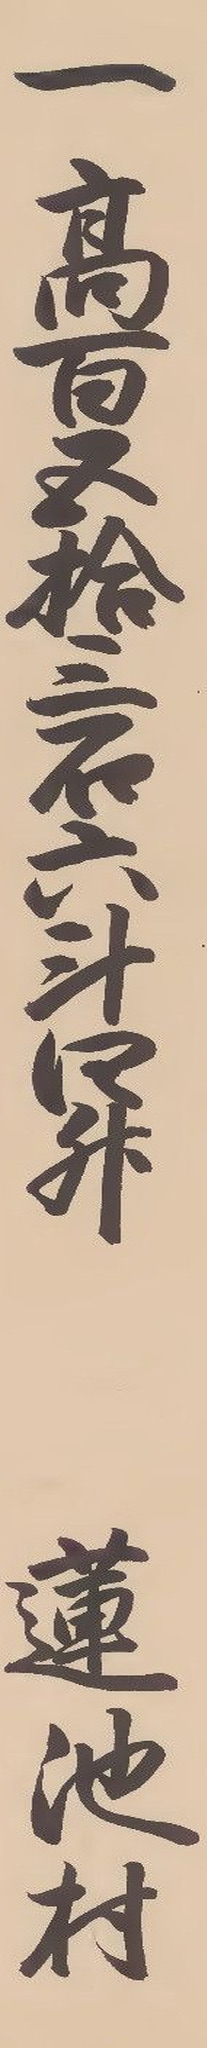一高百五拾三石六斗四升蓮池村
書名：尾張国郷帳
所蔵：国立公文書館 National Archives of Japan
